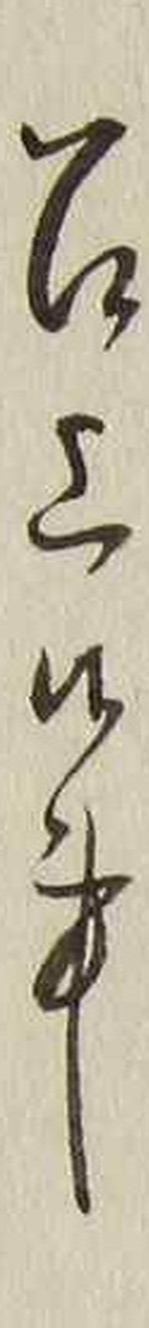召上候事
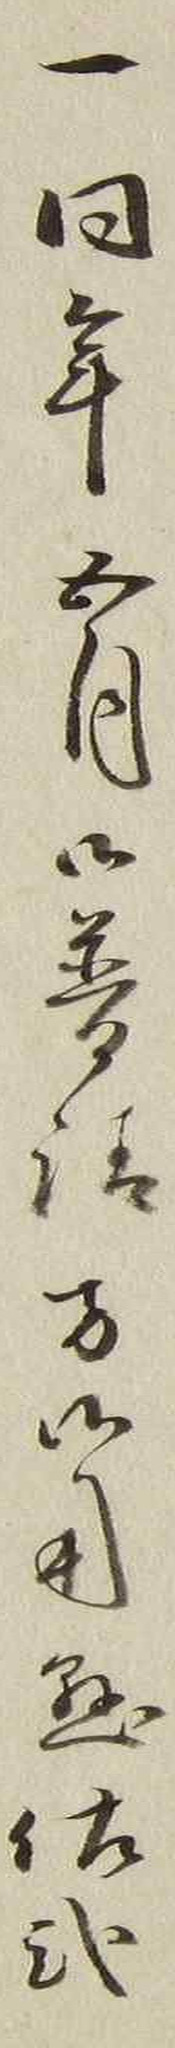一同年五月御普請方御用懸佐弐
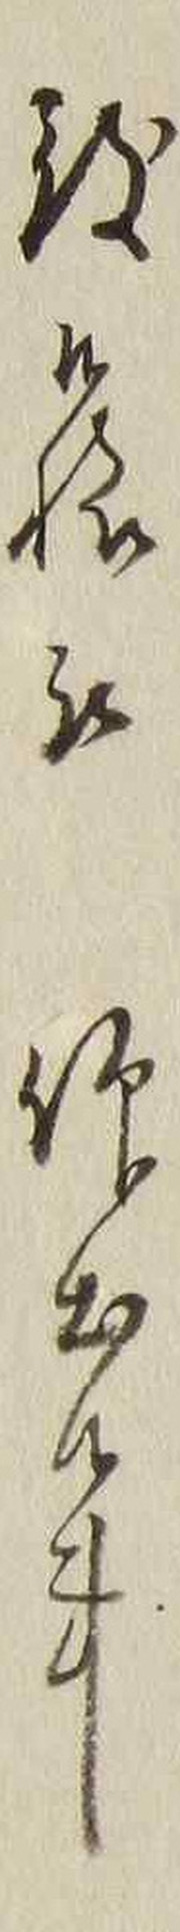致候様仰出候事

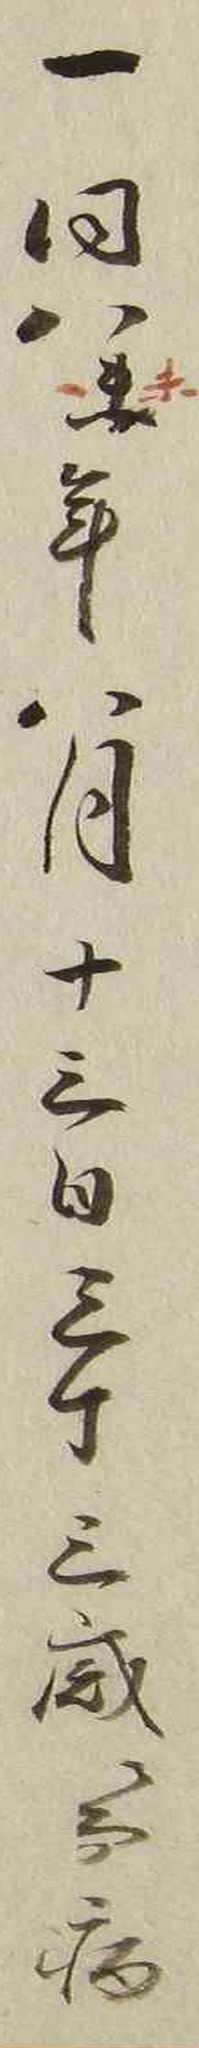一同八未年月八十三日三十三歳事に而病
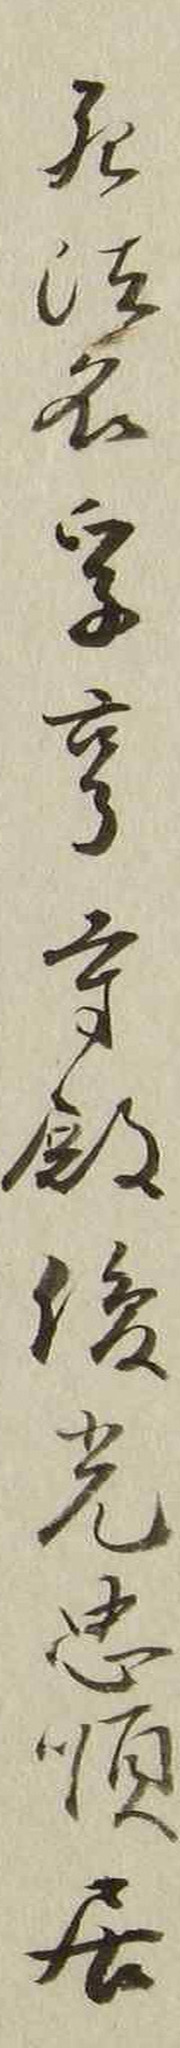死法名寺殿俊光忠順居
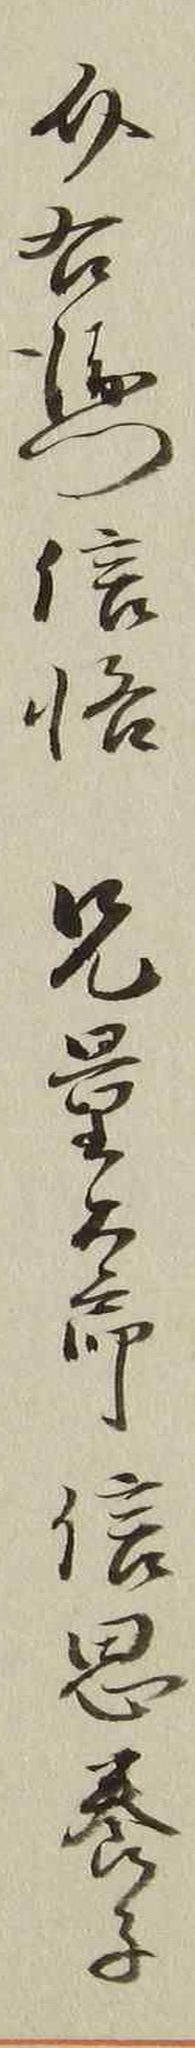介右衛門信悟兄量太節信思養子
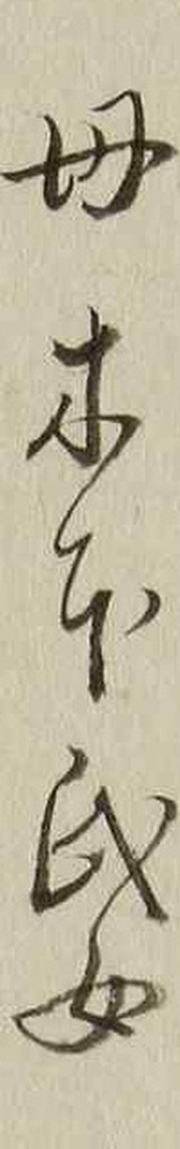母木本氏女
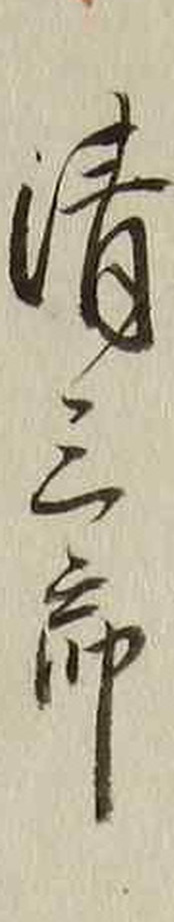清三郎
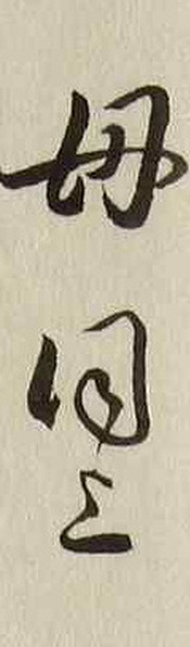母同上
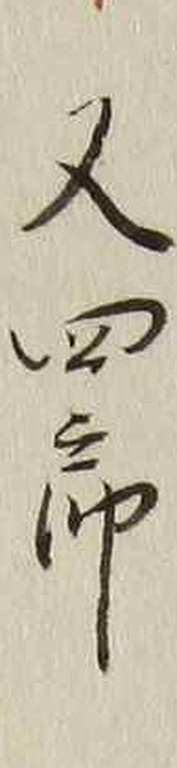又四郎
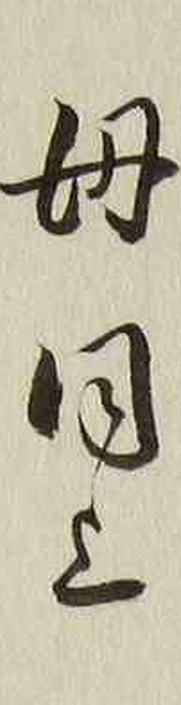母同上
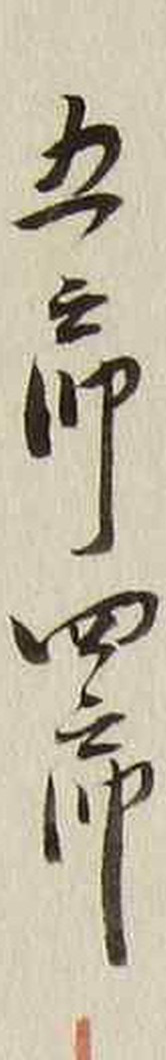五郎四郎
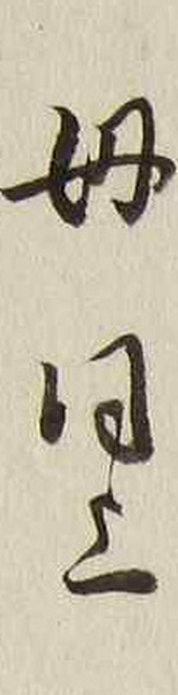母同上

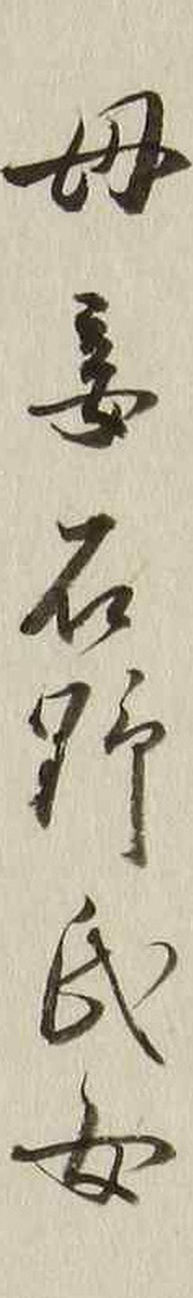母妾石野氏女
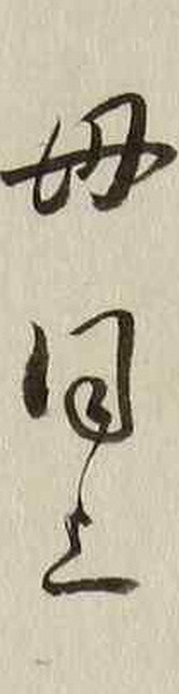母同上
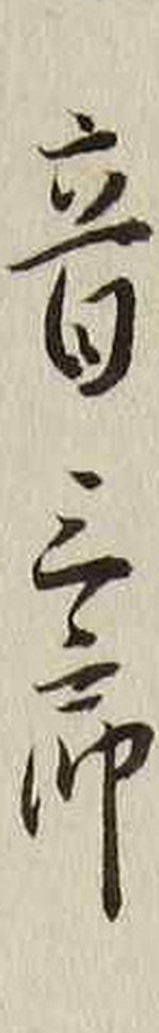音三郎
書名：諸士系譜　巻之159　な之部1
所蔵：会津若松市立会津図書館
